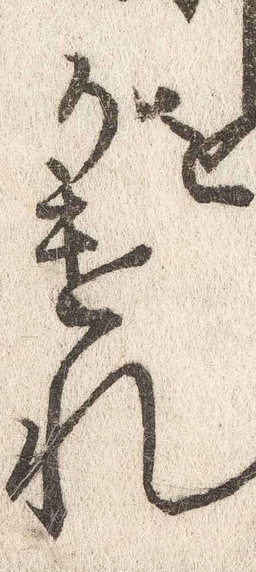かけれ

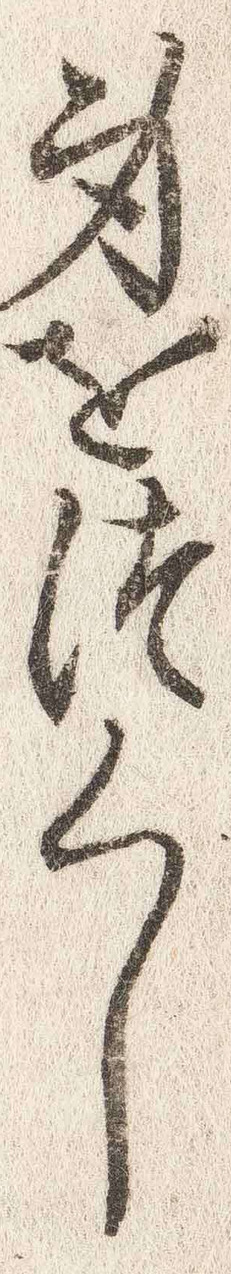みをつくし
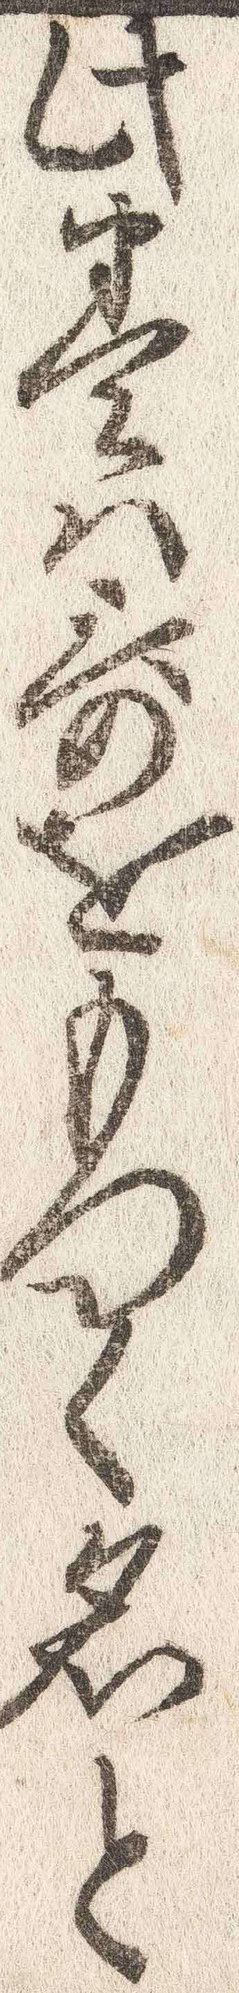此巻は歌をもつて名と
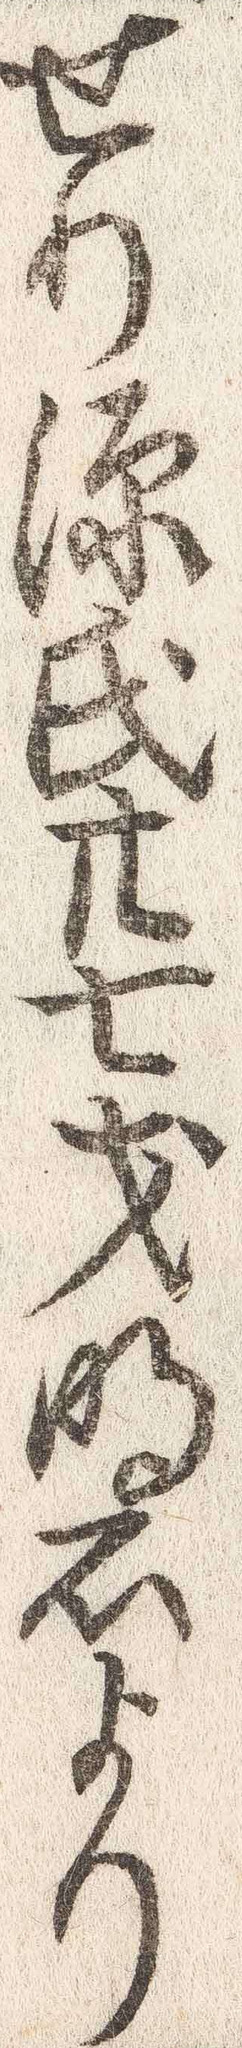せり源氏廿七才明石より
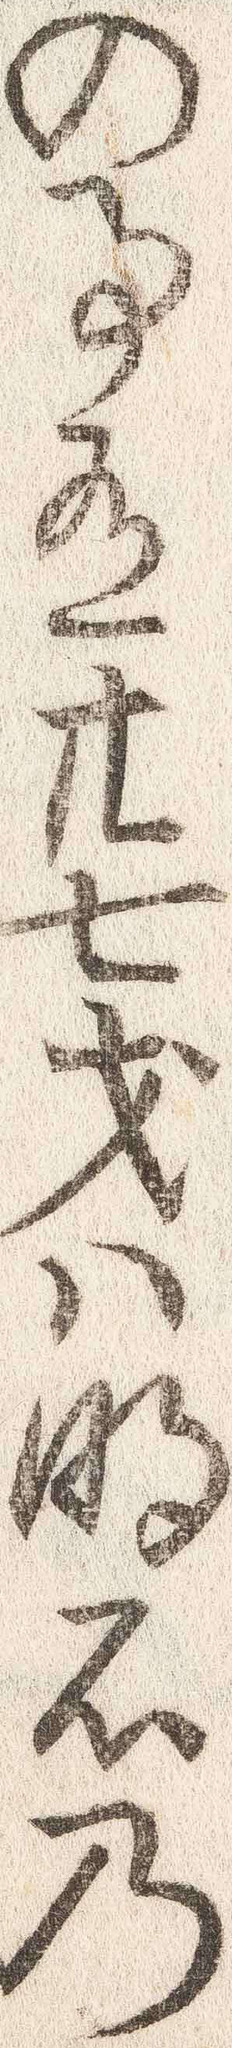の事有廿七才は明石の
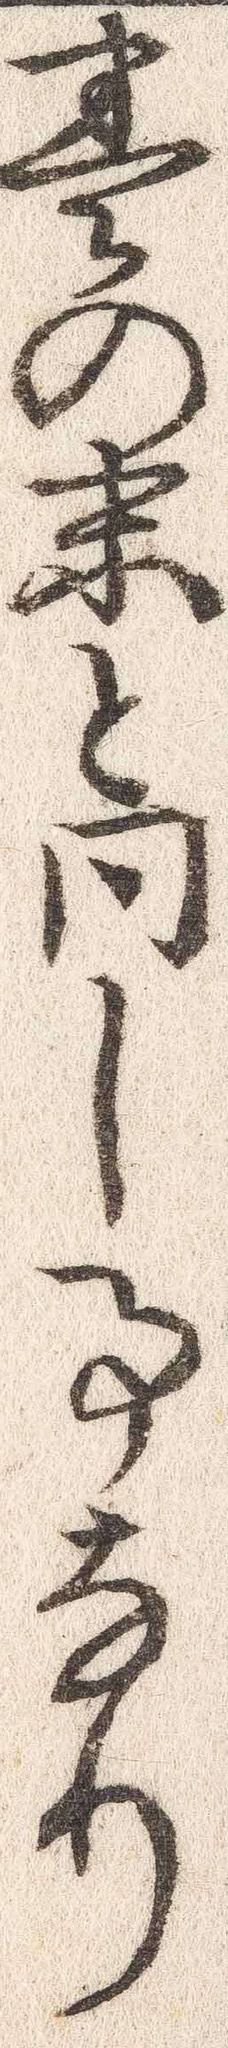巻の末と同し事なり
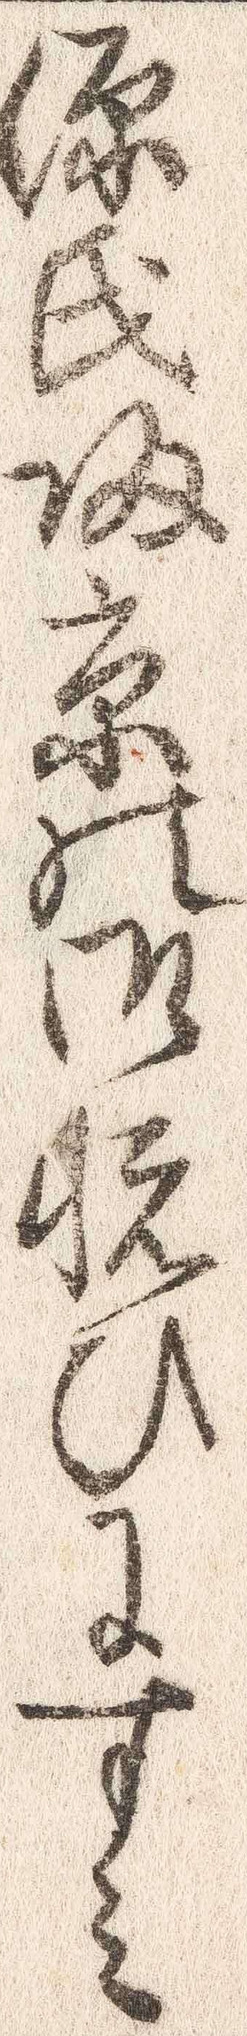源氏帰京の御悦ひにすみ
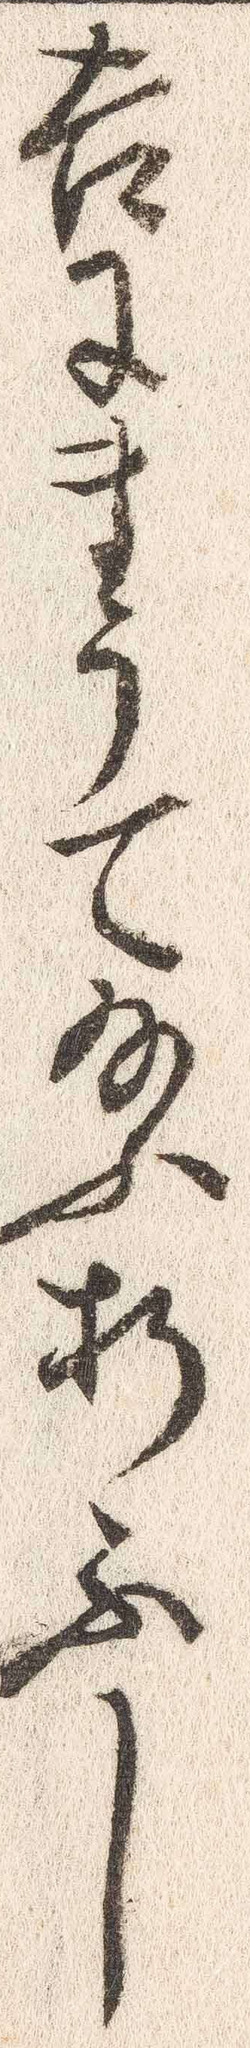吉にまうて給ふ折ふし
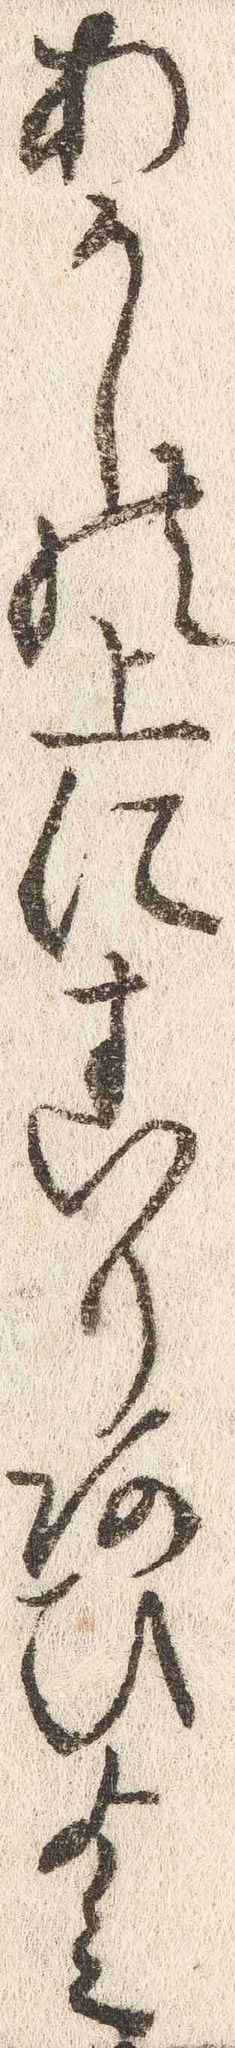あかしの上にまいりあひよみ
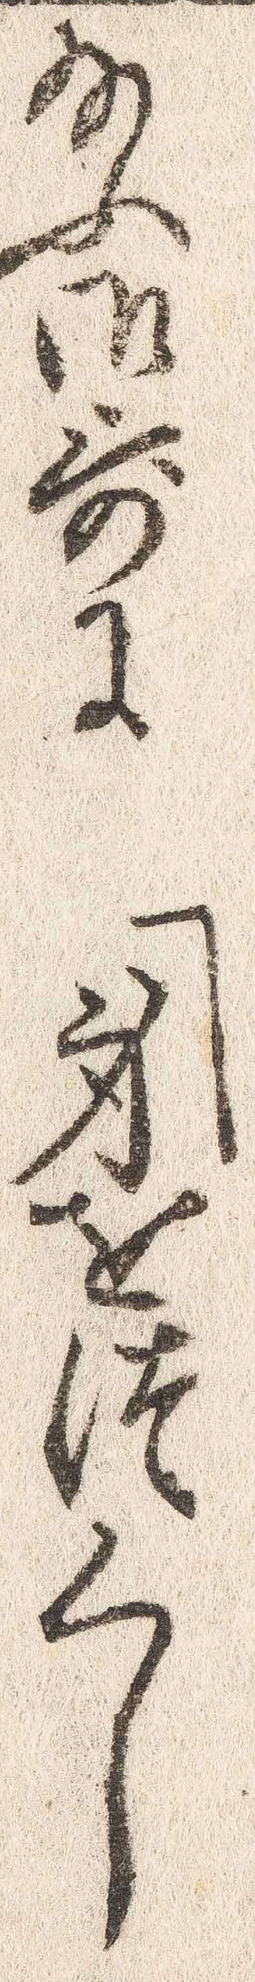給ふ御歌に〽身をつくし
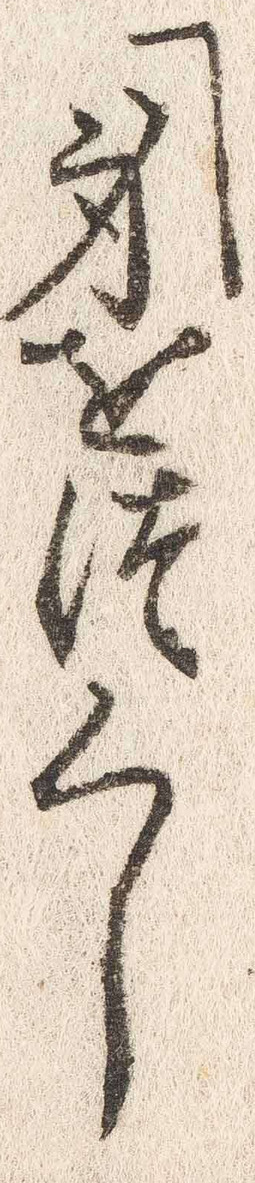みをつくし

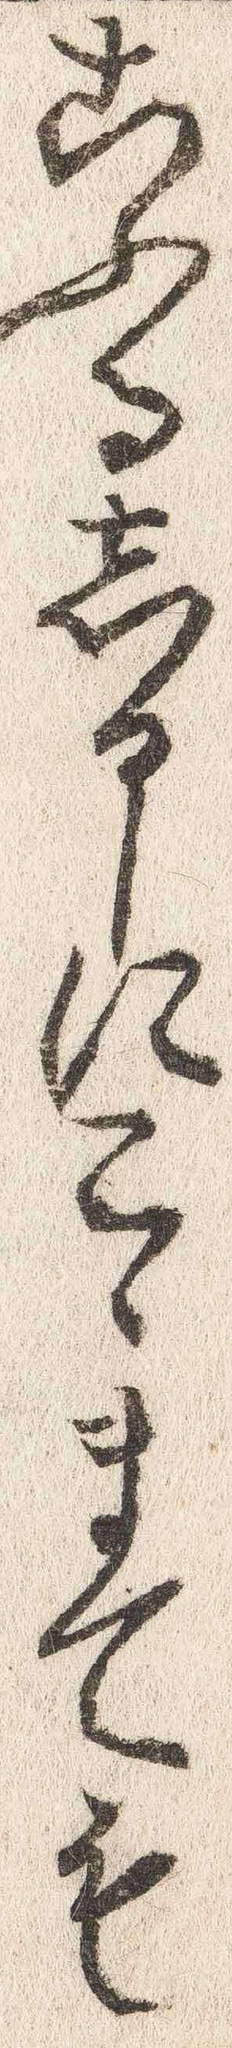こふるしるしにこゝまても
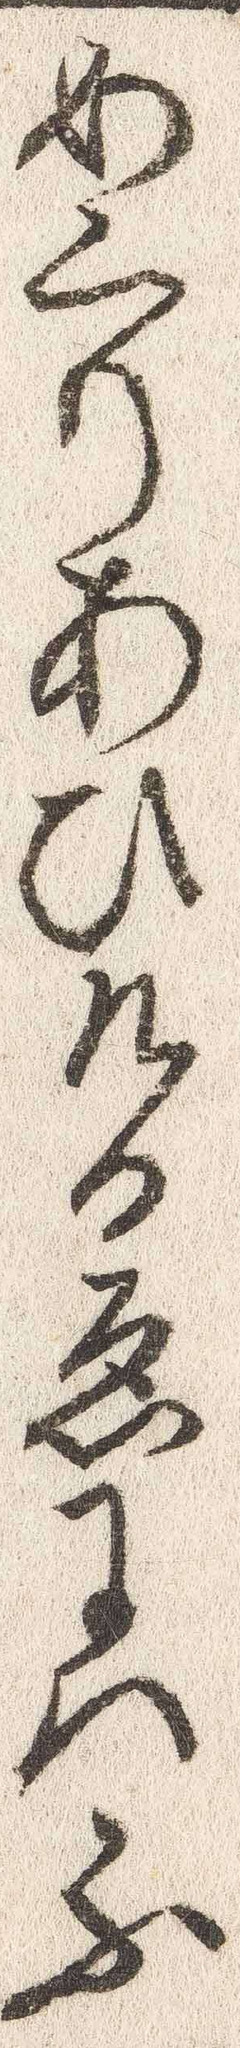めくりあひけるゑにはふ
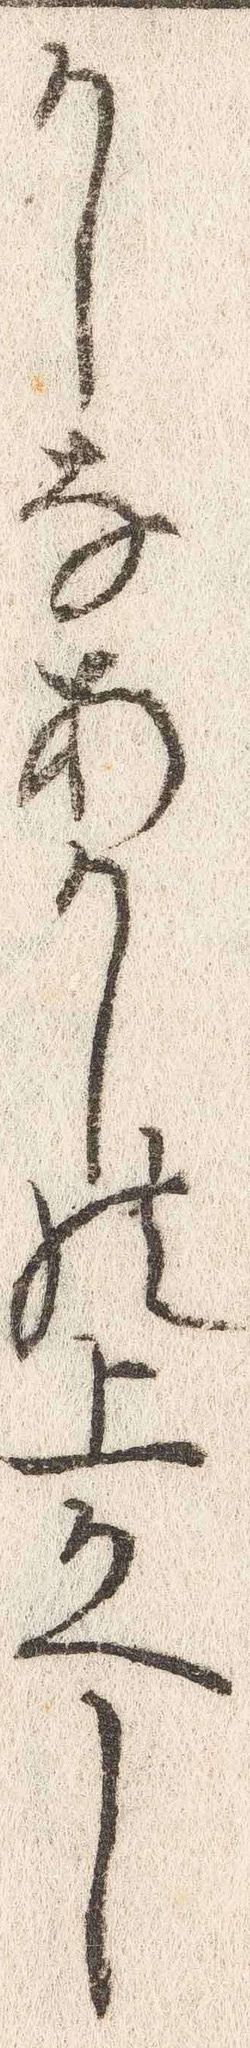かしなあかしの上かへし
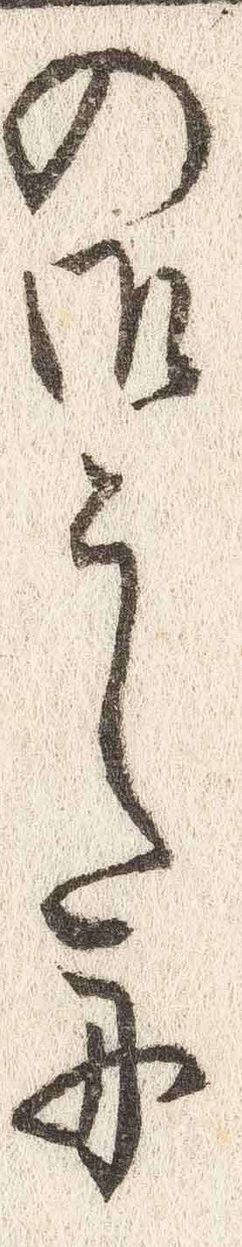の御うたに
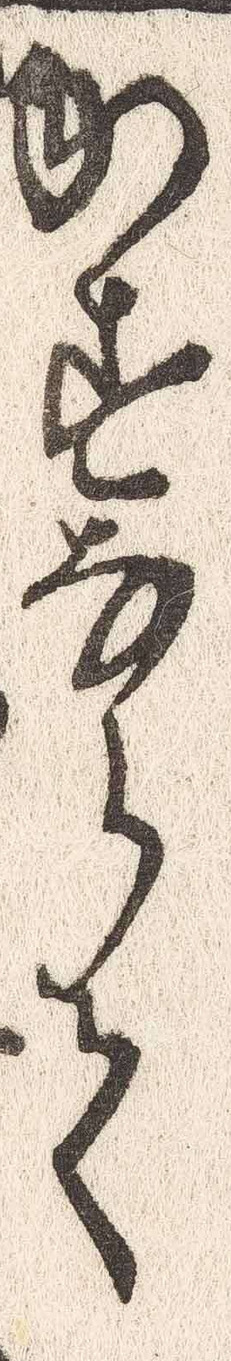かすならて
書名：源氏物語
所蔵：東京学芸大学附属図書館 国文学研究資料館
